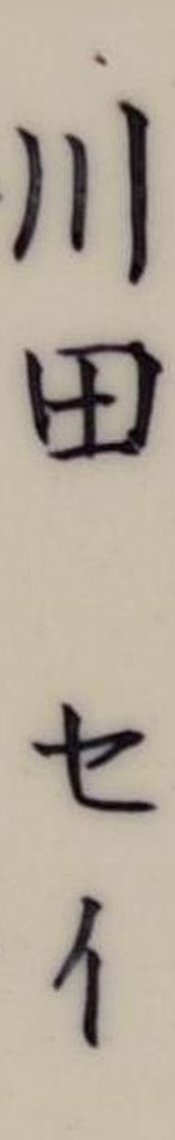川田セイ
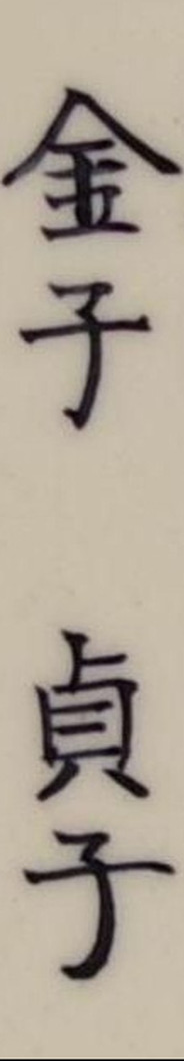金子貞子
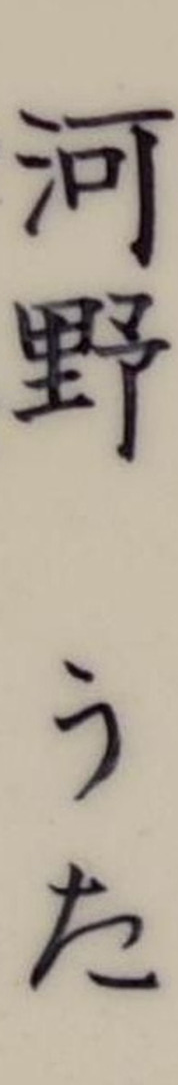河野うた
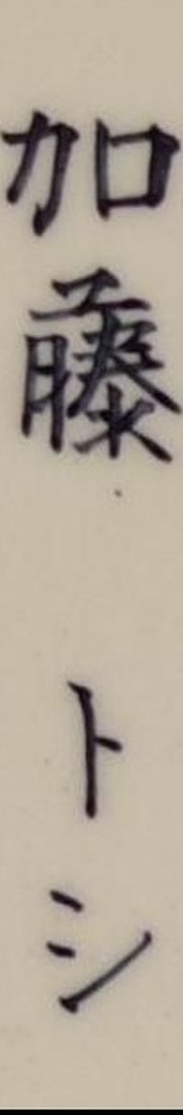加藤トシ
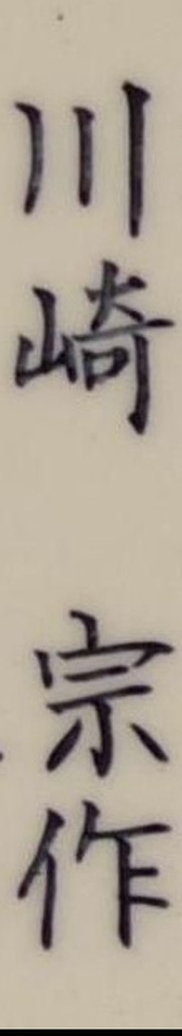川崎宗作
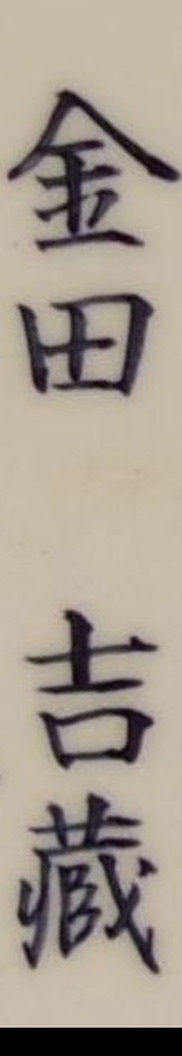金田吉蔵
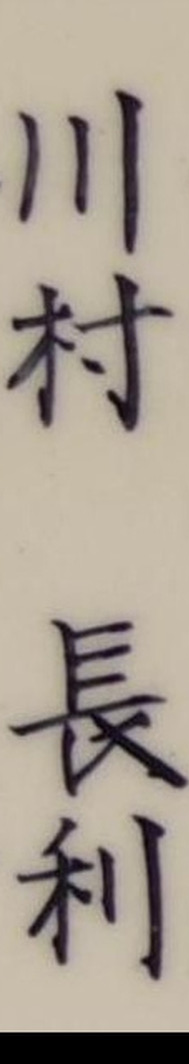川村長利
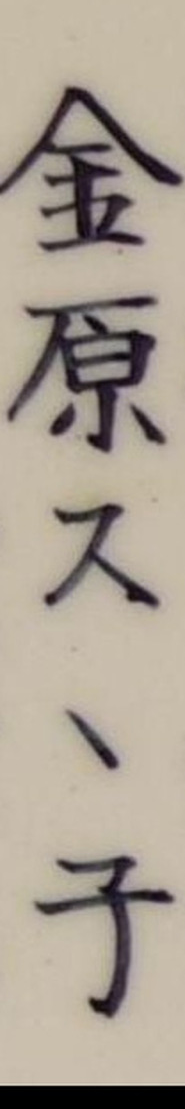金原スゝ子
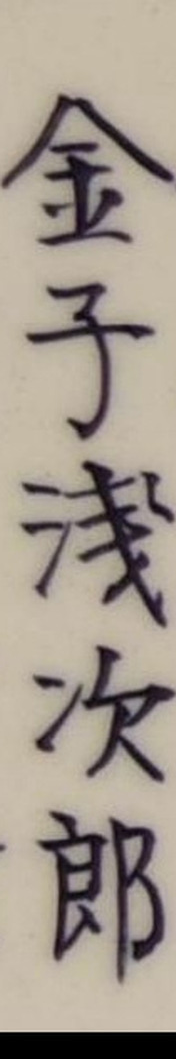金子浅次郎
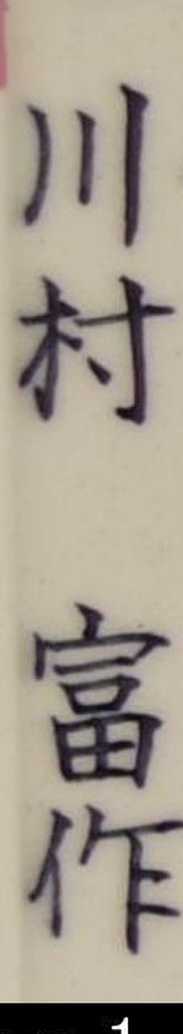川村富作

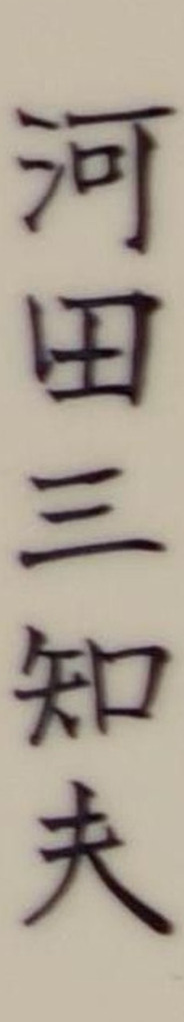河田三知夫
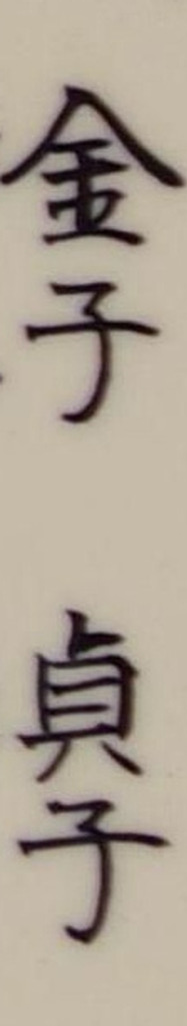金子貞子
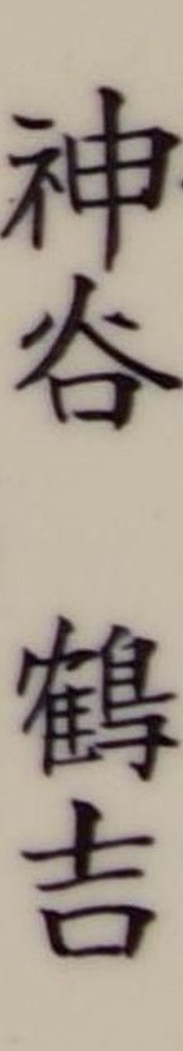神谷鶴吉
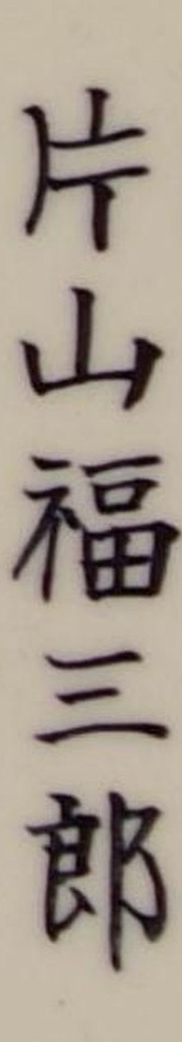片山福三郎
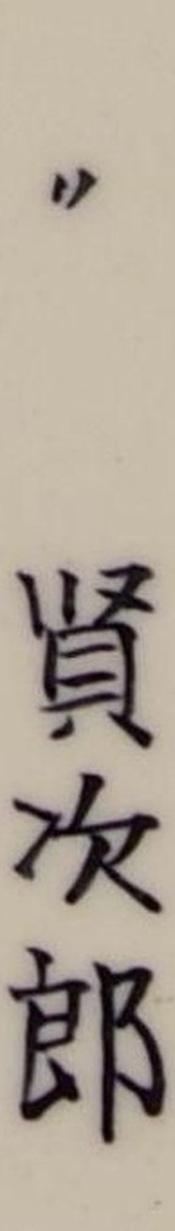賢次郎
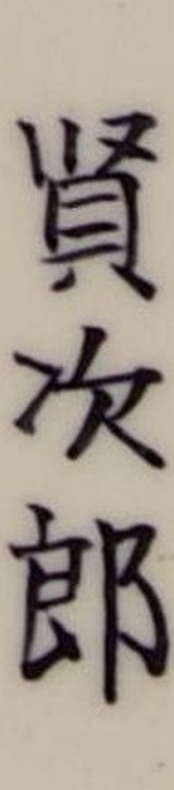賢次郎
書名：M~S
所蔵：高野山金剛峯寺
